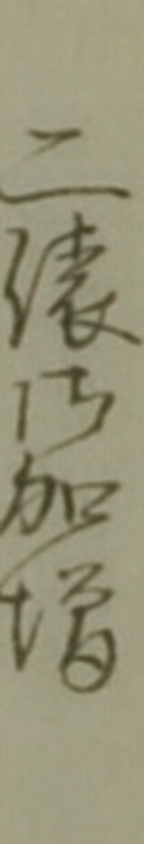二俵御加増
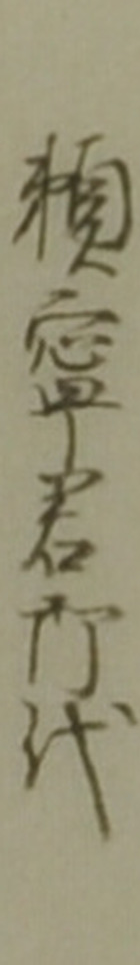頼寧君御代
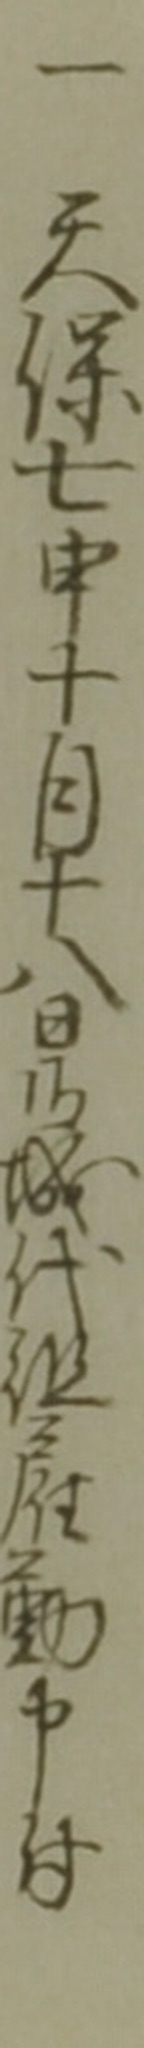一天保七申十月十八日御城代組雇勤申付
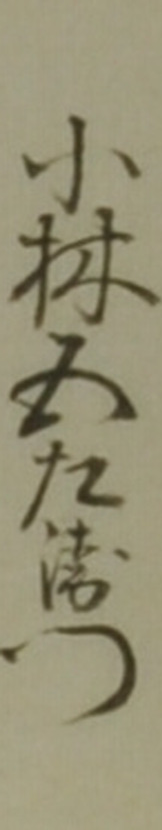小林五左衛門
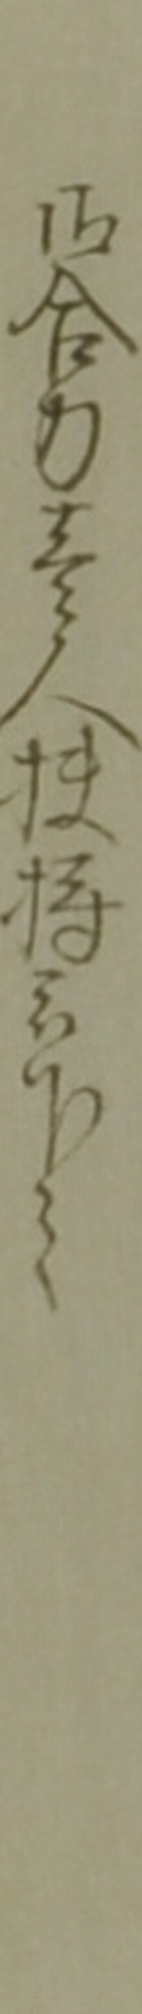御合力壱人扶持被下之
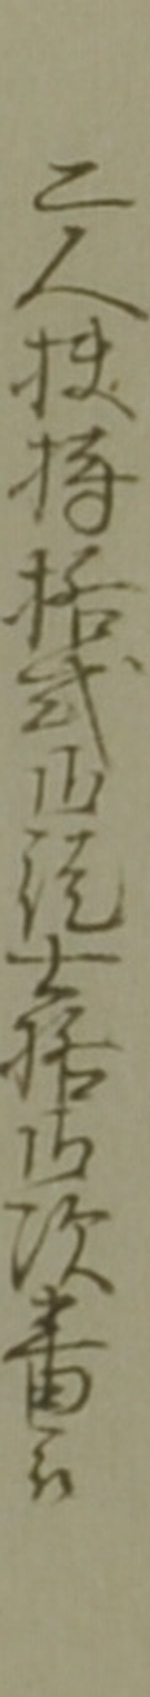二人扶持格式御徒士格御次番被
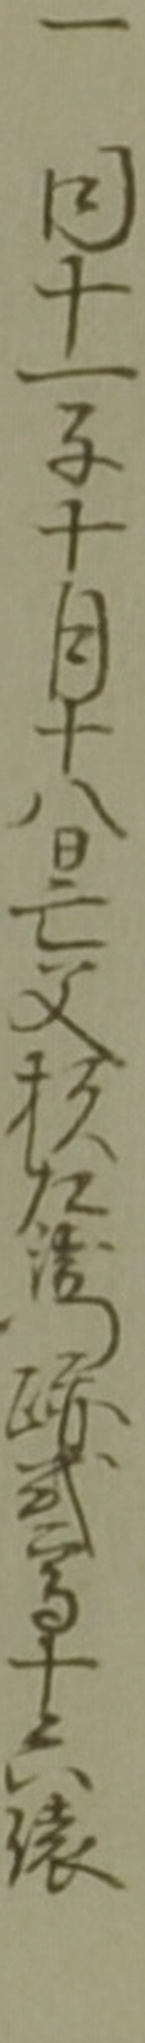一同十一子十月十八日亡父杉左衛門跡式高十六俵
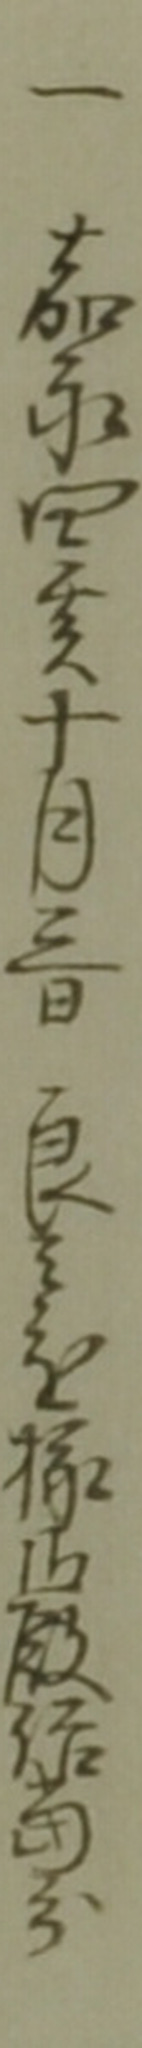一嘉永四亥十月三日良之進様御殿詰当分
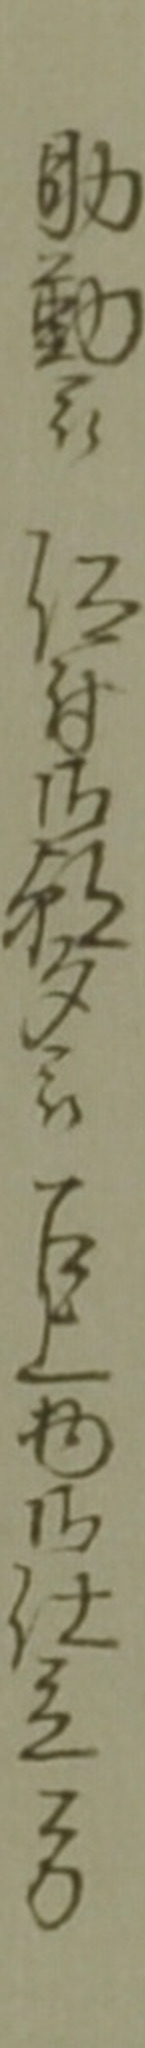助勤被仰付御朝夕被召上物御仕立方
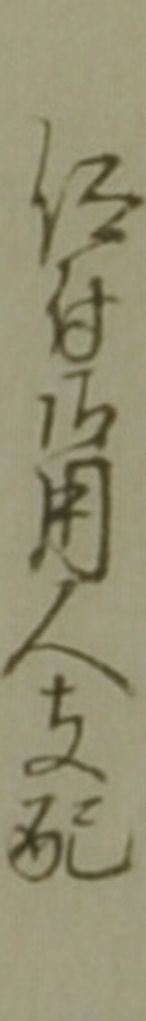仰付御用人支配

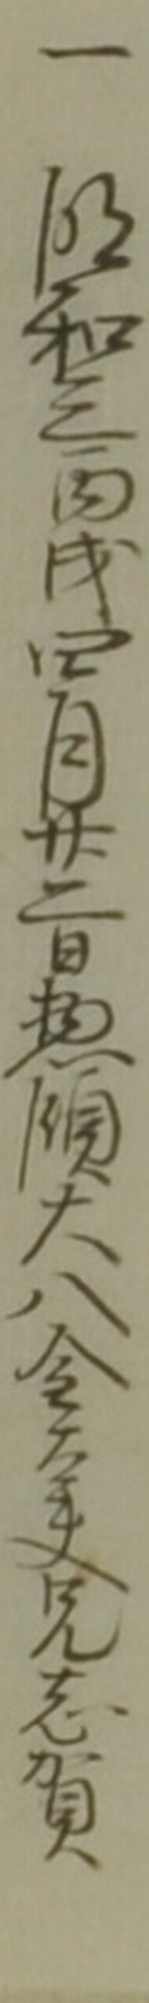一明和三丙戌四月廿二日惣領大八金太夫兄志賀
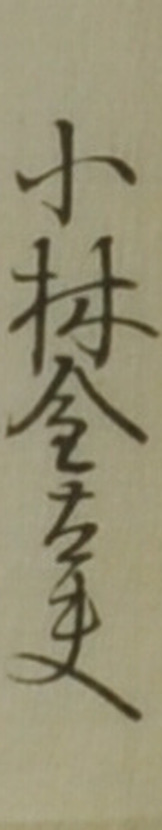小林金太夫
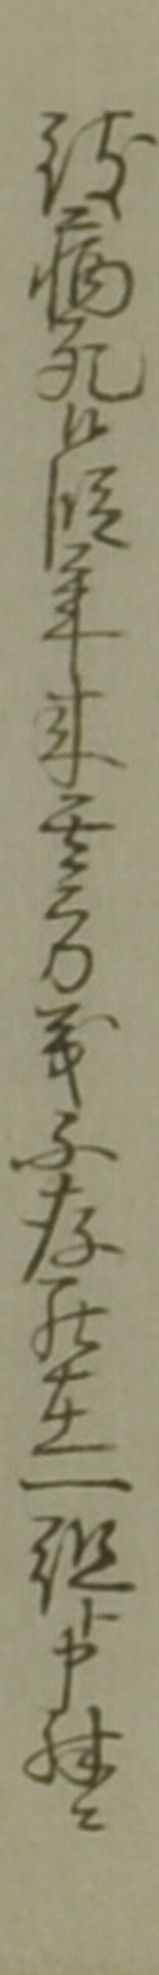致病死候段年来其方義不存罷在一組ト申殊ニ
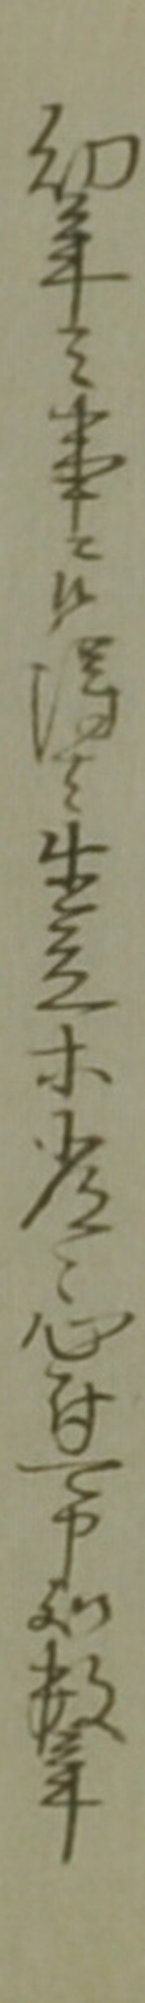幼年之事ニ候得者生立等常々心付可申処数年
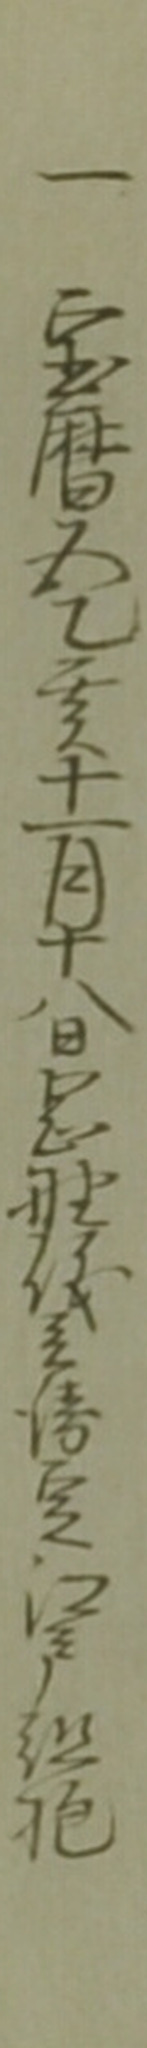一宝暦五乙亥十一月十八日岡野儀兵衛定江戸組抱
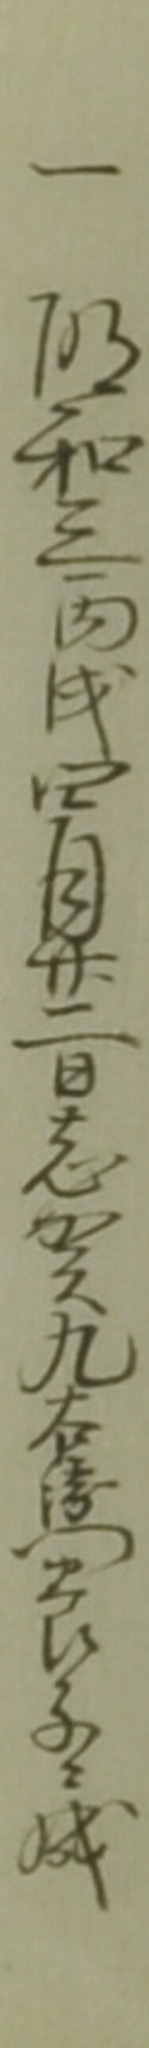一明和三丙戌四月廿二日志賀九右衛門養子ニ成
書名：無足諸士勤仕録（七）
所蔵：伊那市立高遠町図書館・合同会社AMANE
